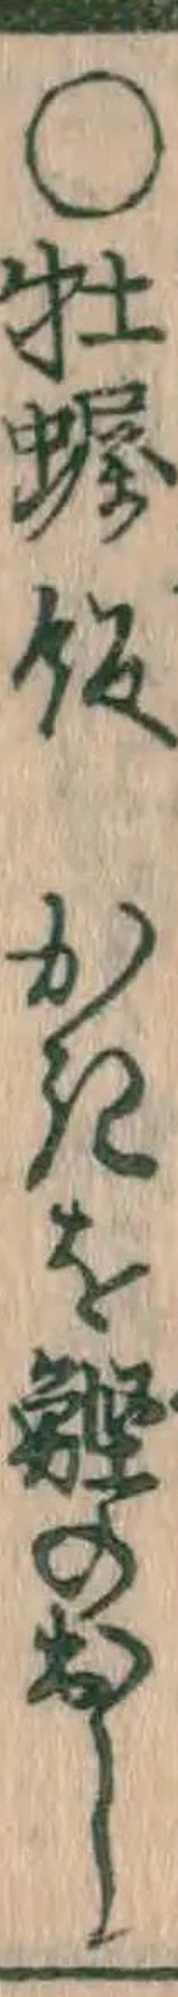○牡蛎飯かきを鰹の出し
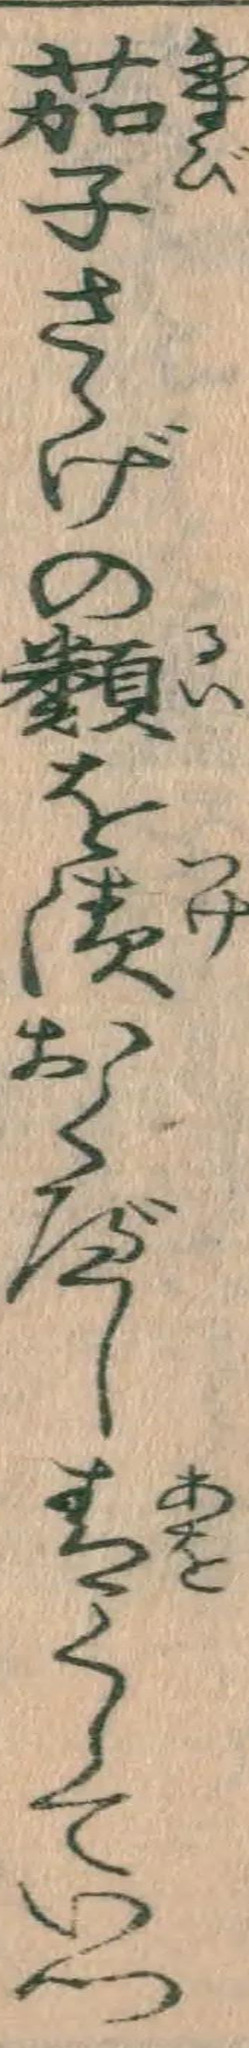茄さゝげの類を漬おくべし青くしていつ
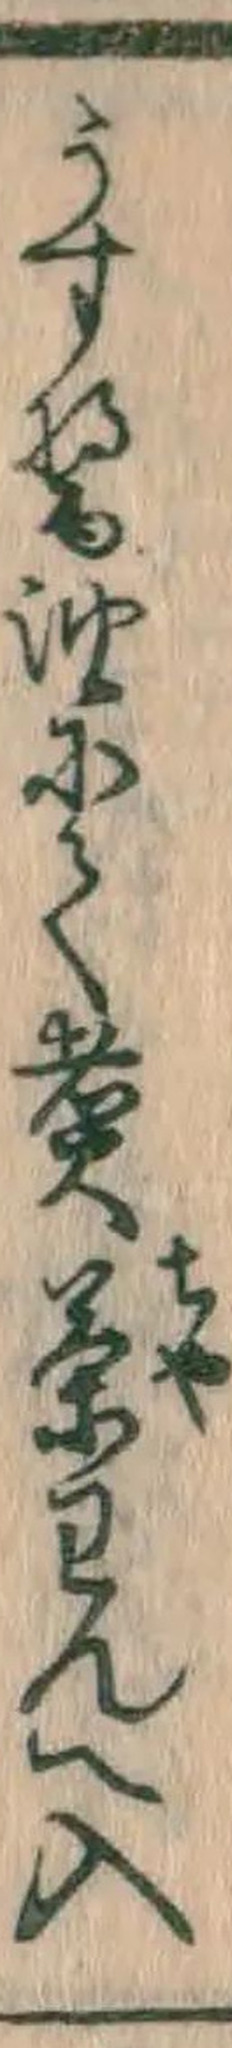うす醬油にて煮茶わんへ入
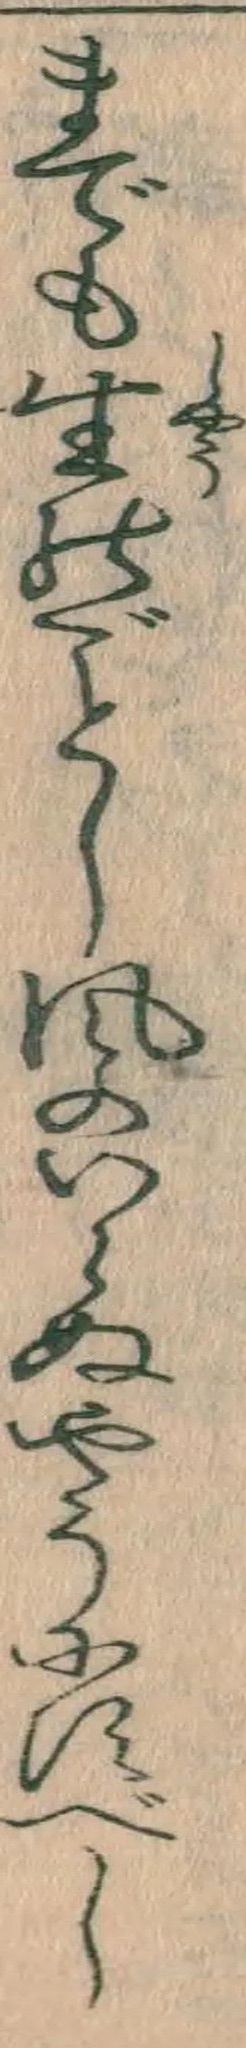までも生のごとし風のいらぬやうにすべし
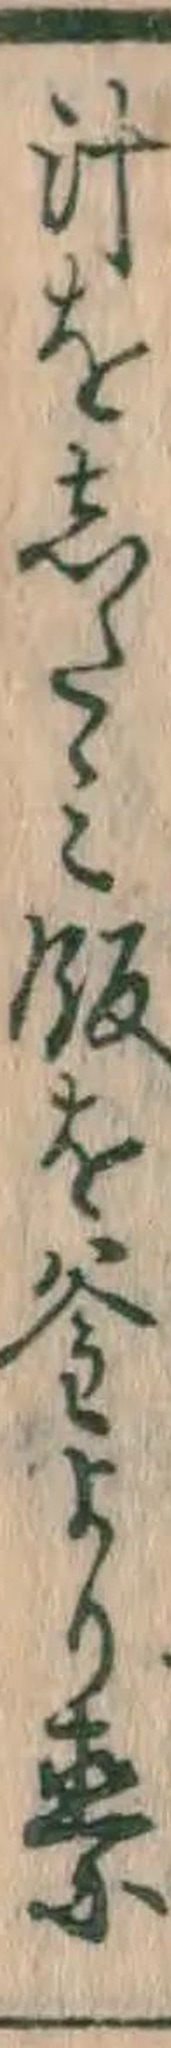汁をしたみ飯を釜より直に
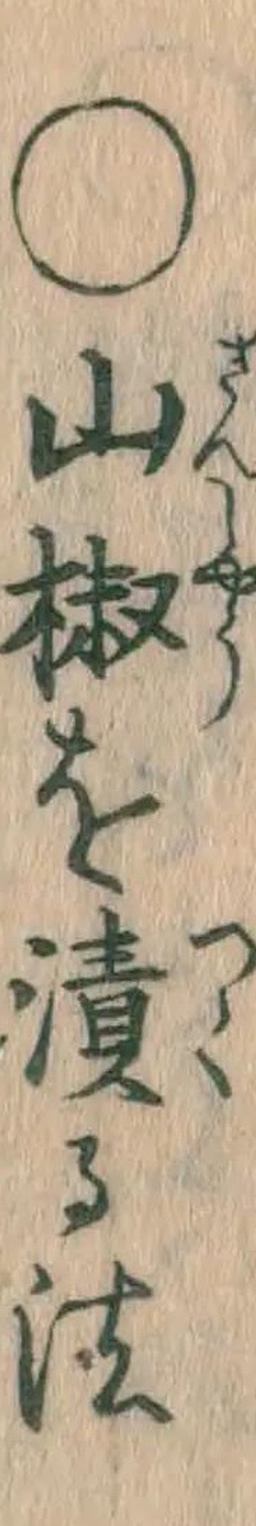○山椒を漬る法
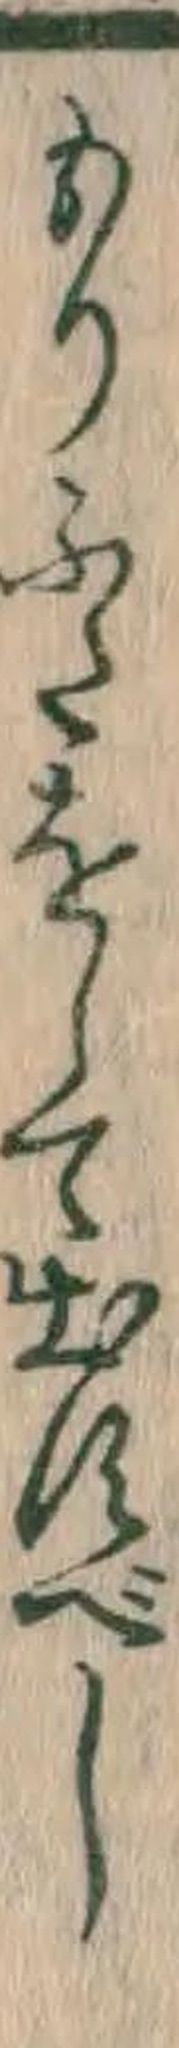もりふたをして出すべし
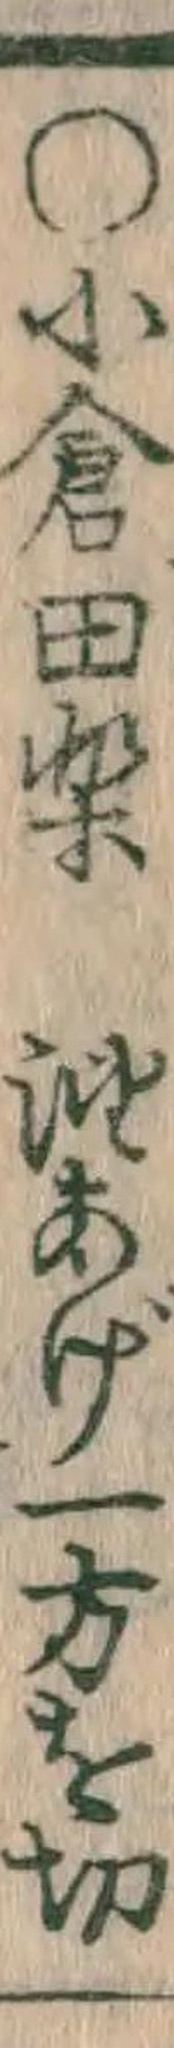○小倉田楽油あげ一方を切
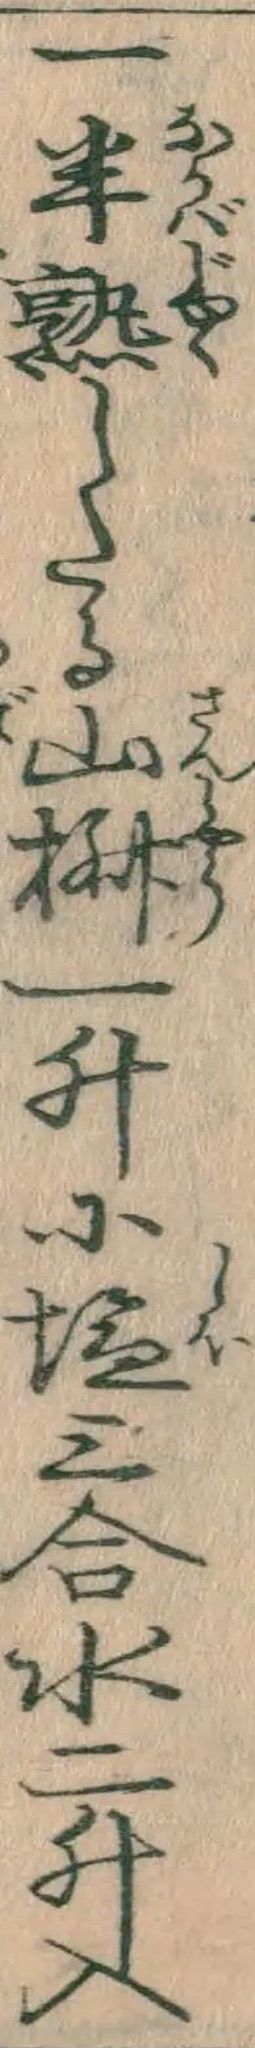一半熟したる山枡一升に塩三合水二升入
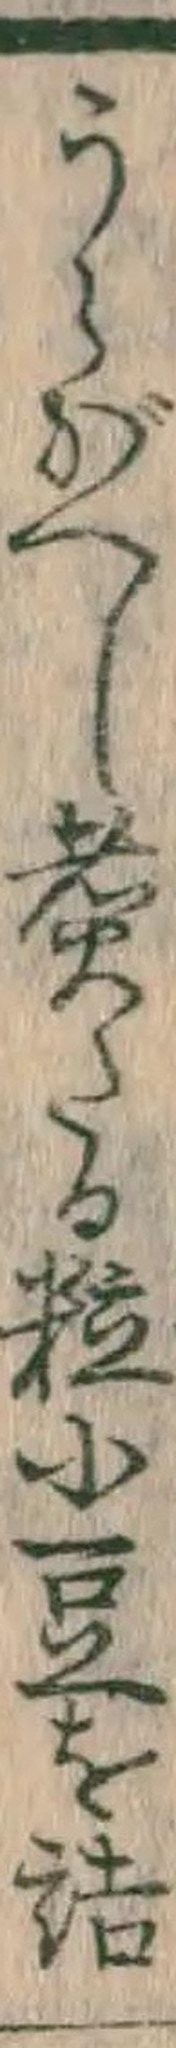うらがへし煮たる粒小豆を詰
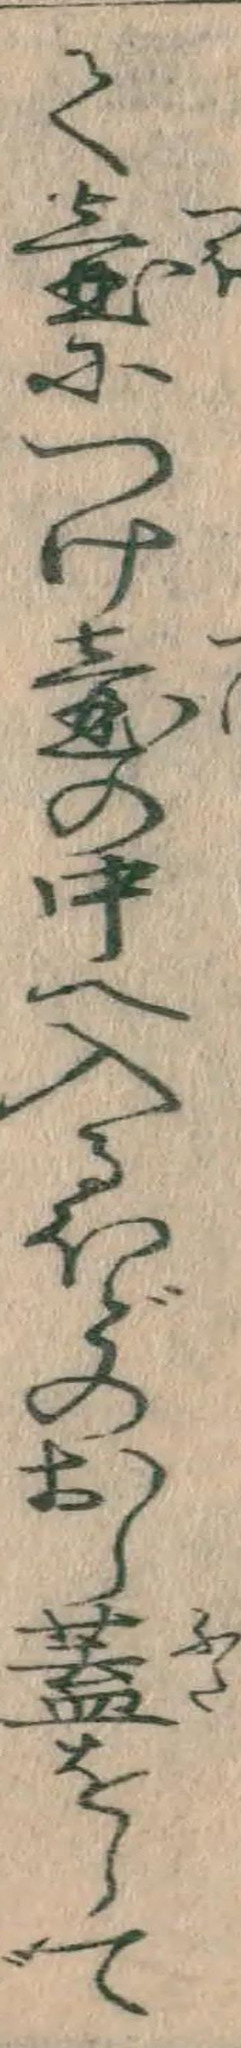て壺につけ壺の中へ入るほどのおし蓋をして
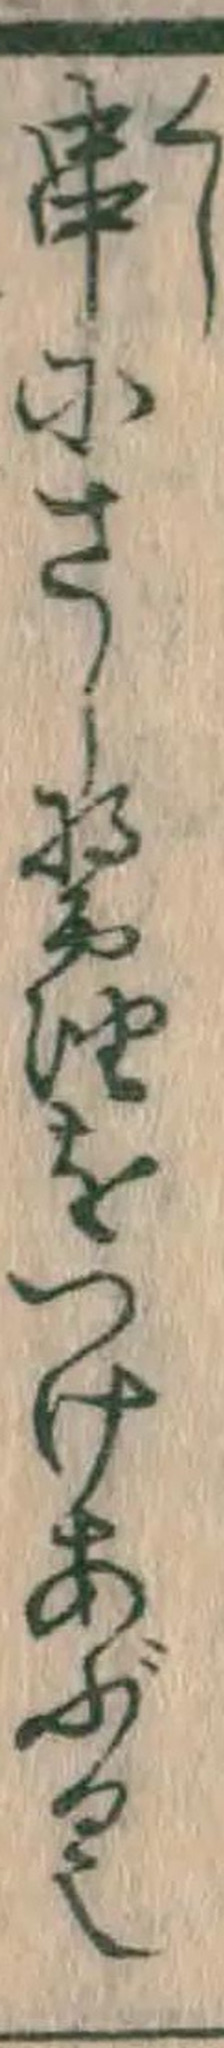串にさし醬油をつけあぶる也
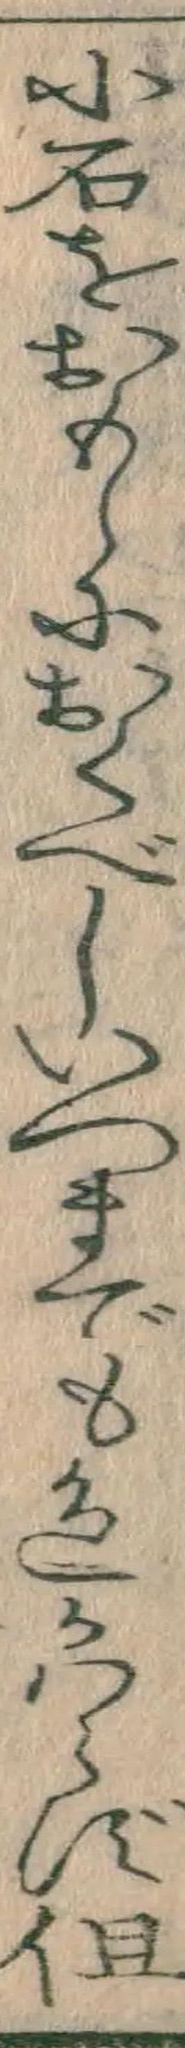小石をおもしにおくべしいつまでも色かはらず但
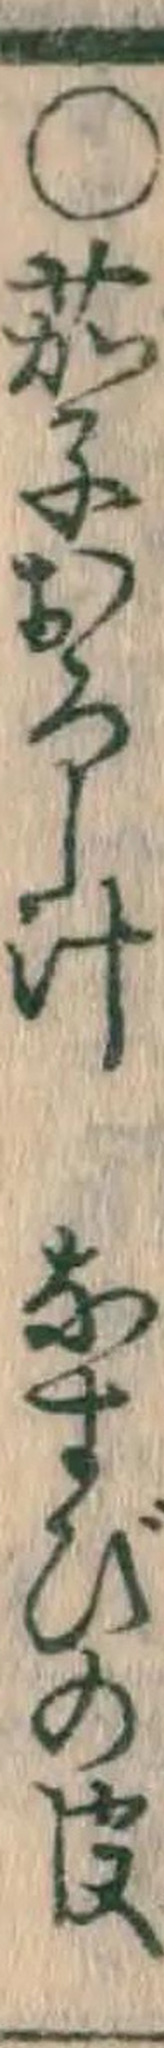○茄子おろし汁なすびの皮
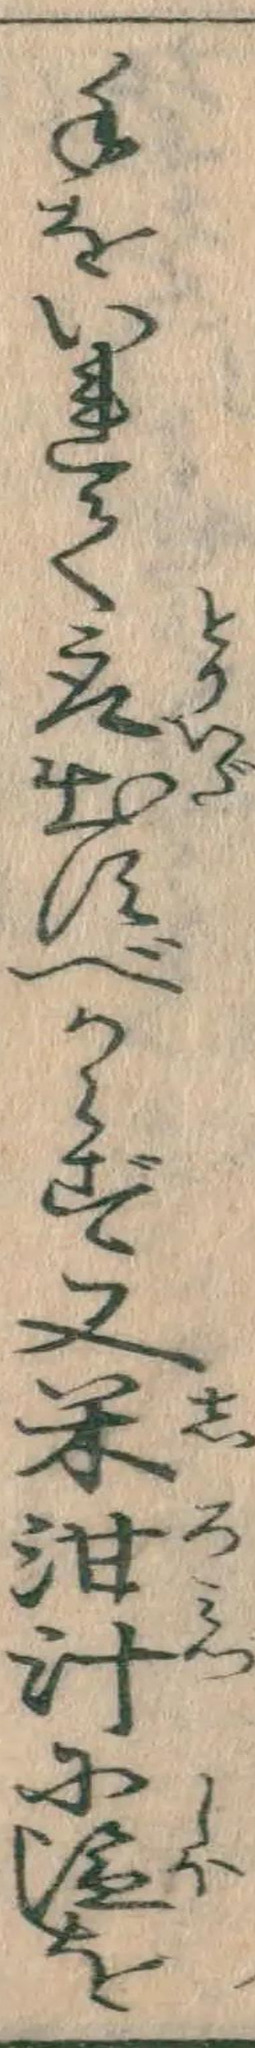手をいれて取出すべからず又米泔汁に塩を
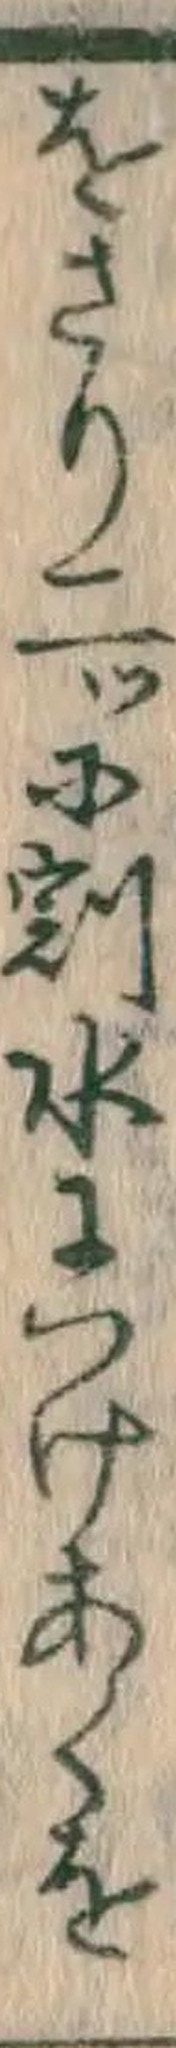をさり二ッに割水につけあくを
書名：広益秘事大全 3巻. [5]
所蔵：国立国会図書館 National Diet Library, JAPAN
